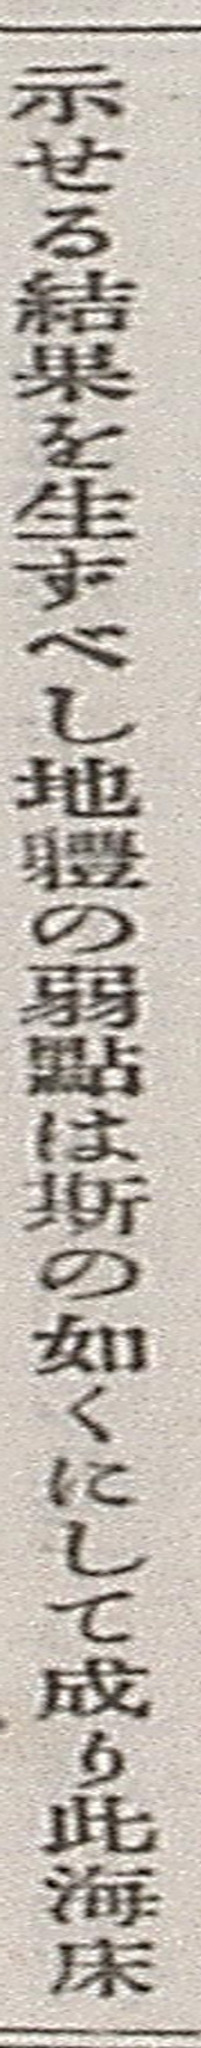示せる結果を生ずべし地体の弱点は斯の如くにして成り此海床
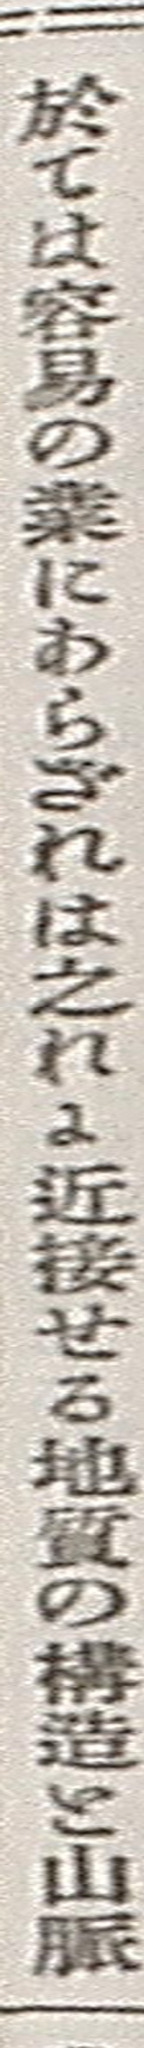於ては容易の業にあらざれは之れに近接せる地質の構造と山脈
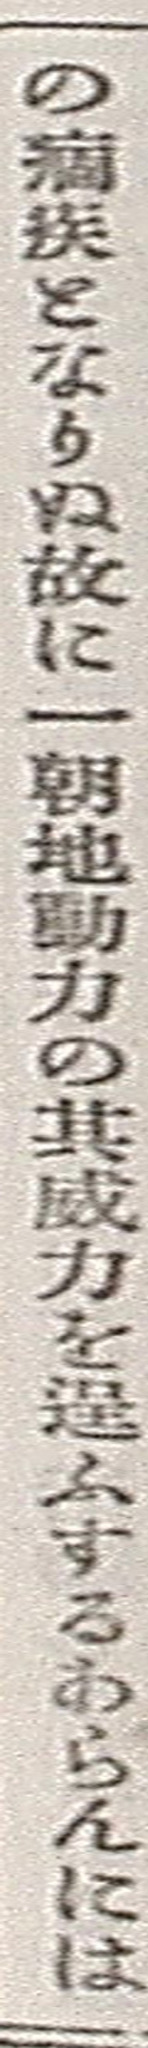の痼疾となりぬ故に一朝地動力の其威力を逞ふするあらんには
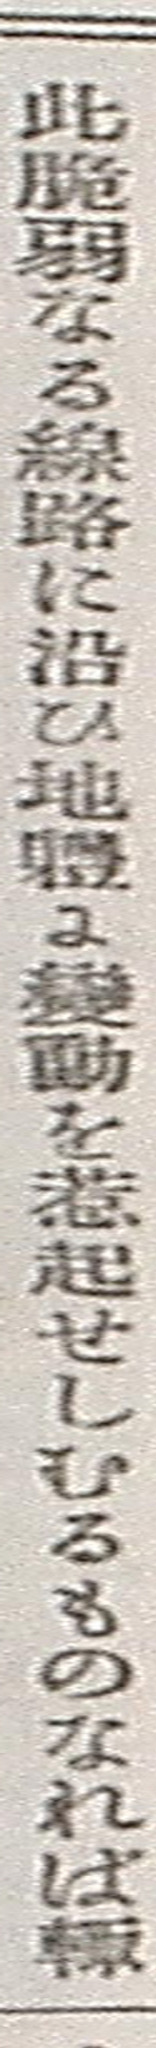此脆弱なる線路に沿ひ地体に変動を惹起せしむるものなれば輙
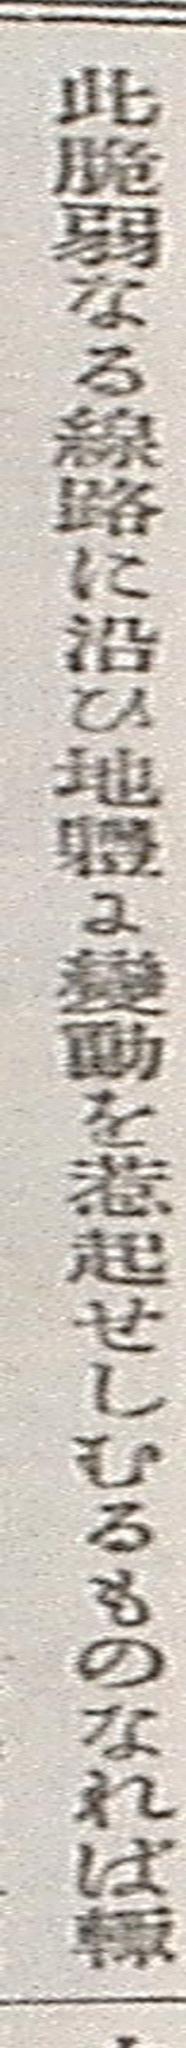此脆弱なる線路に沿ひ地体に変動を惹起せしむるものなれば輙
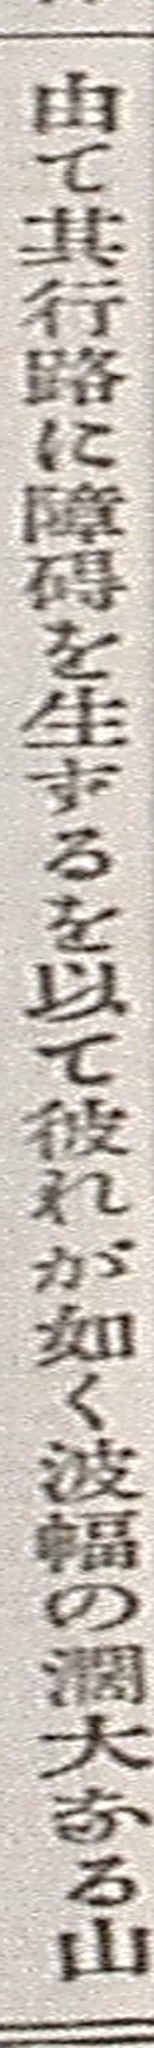由て其行路に障碍を生ずるを以て彼れが如く波幅の濶大なる山
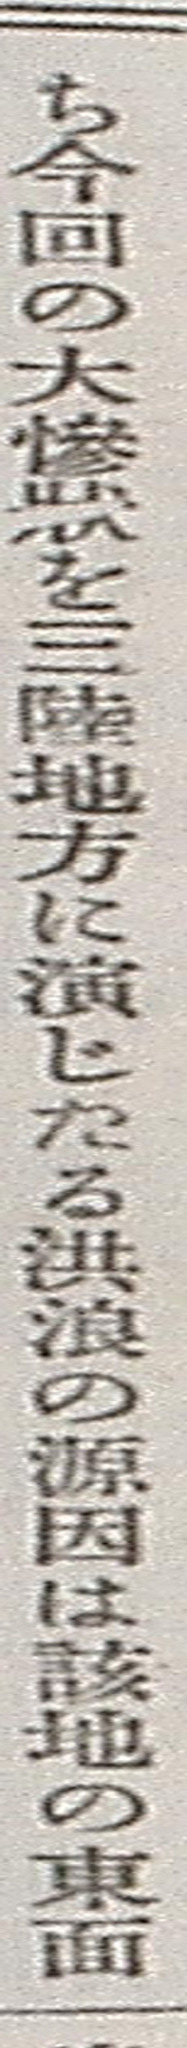ち今回の大惨状を三陸地方に演じたる洪浪の源因は該地の東面
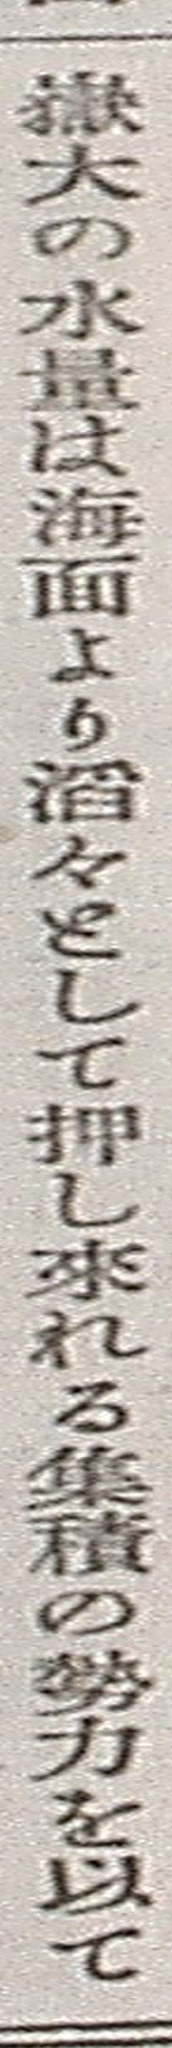嶽大の水量は海面より滔々として押し来れる集積の勢力を以て
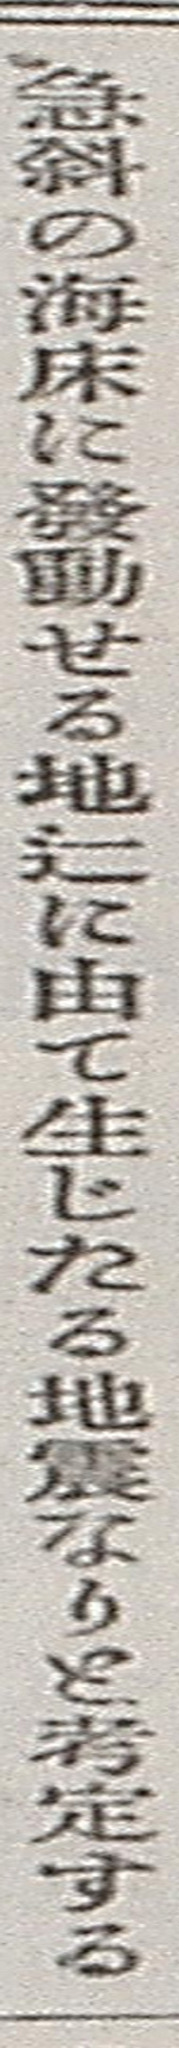急斜の海床に発動せる地辷に由て生じたる地震なりと考定する
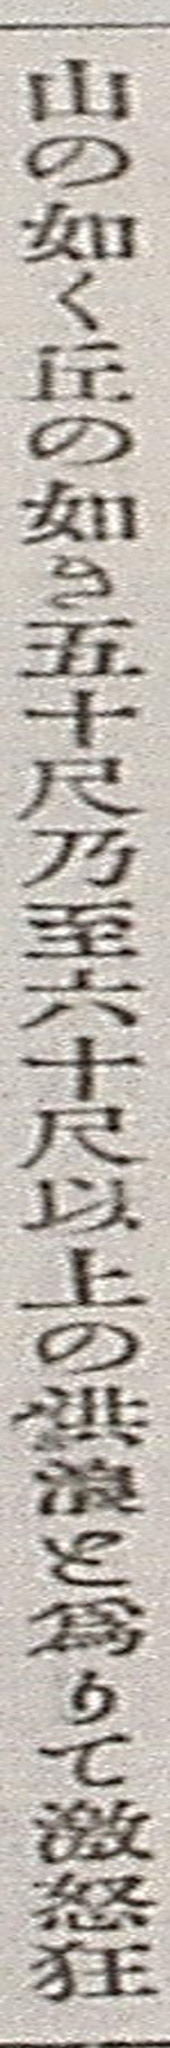山の如く丘の如き五十尺乃至六十尺以上の洪浪と為りて激怒狂
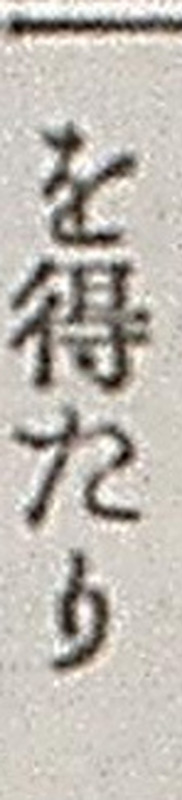を得たり
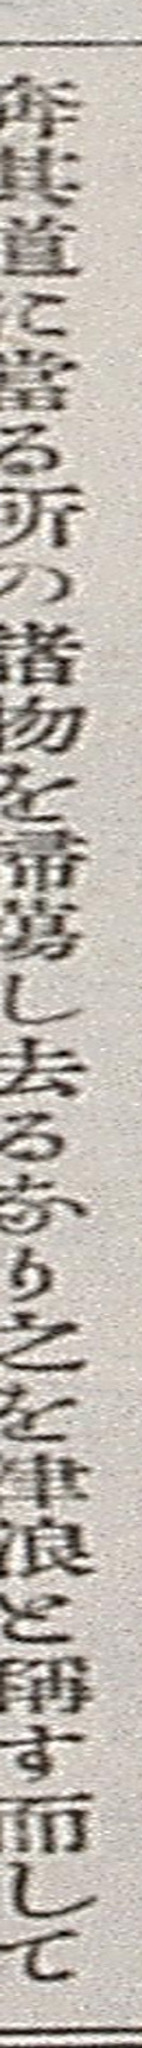奔其道に当る所の諸物を掃蕩し去るなり之を津浪と称す而して
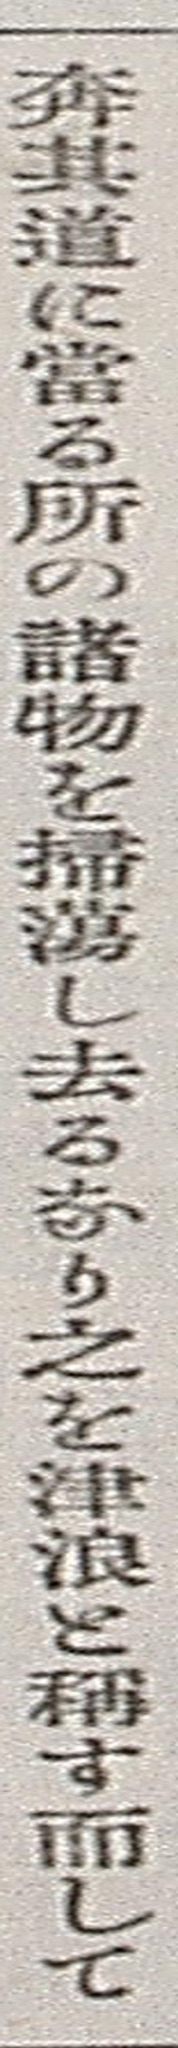奔其道に当る所の諸物を掃蕩し去るなり之を津浪と称す而して
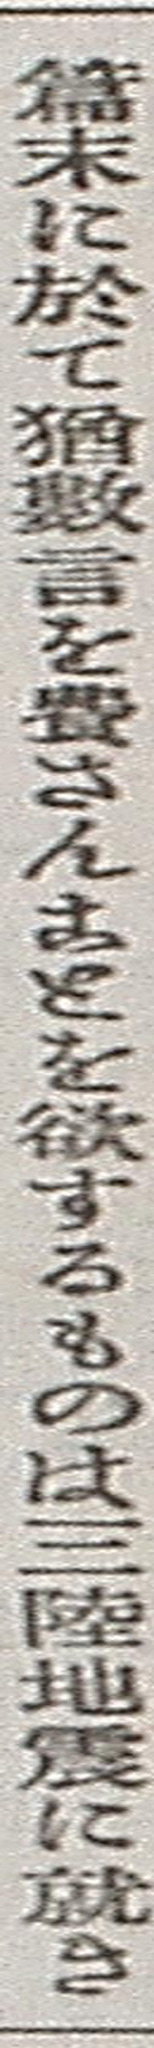篇末に於て猶数言を費さんことを欲するものは三陸地震に就き
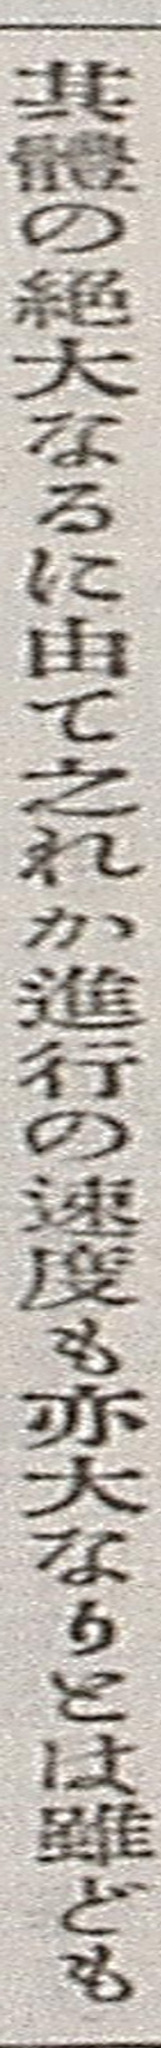其体の絶大なるに由て之れか進行の速度も亦大なりとは雖ども
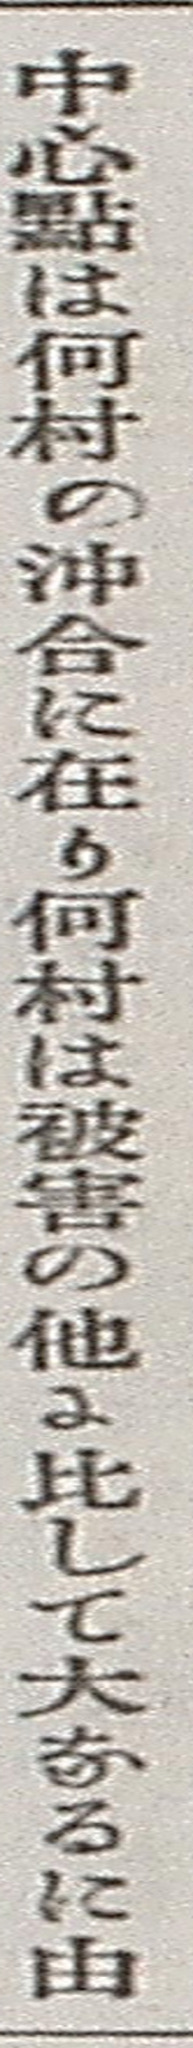中心点は何村の沖合に在り何村は被害の他に比して大なるに由
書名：風俗畫報臨時増刊第百二十號　大海嘯被害録（下）
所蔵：東京大学地震研究所図書室 Earthquake Research Institute Library, The University of Tokyo, JAPAN
